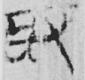取
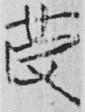皮（彼）
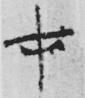才（在）
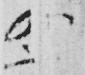坹（穴）
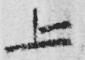上
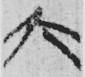六
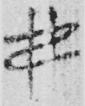弗
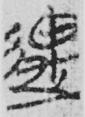遇
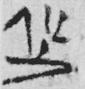○（過）
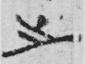之
